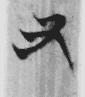又
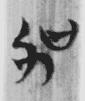加
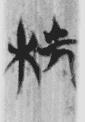橈
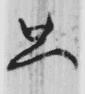也
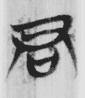君
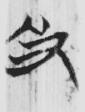及
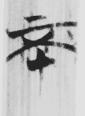不
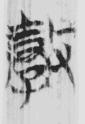{𣪊子}
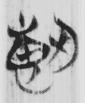{叀刀}
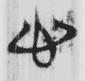心
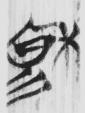穆
